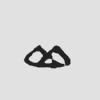凶
